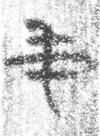屯
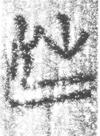芒
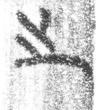之
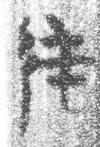純
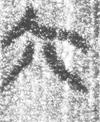六
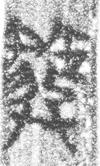○（篾）
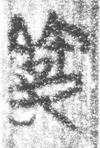○（筵）
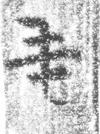屯
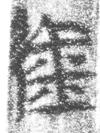○（錦）
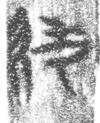純
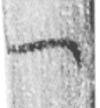一
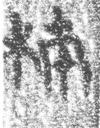○（桃）
